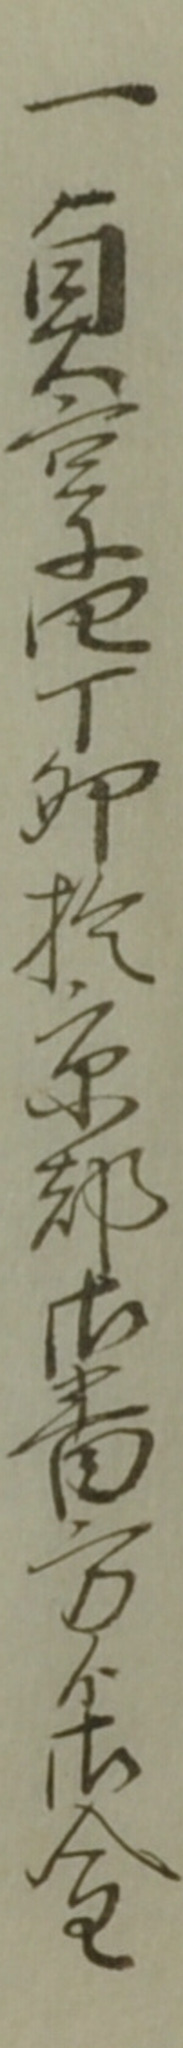一貞享四丁卯於京都御番方ゟ御金
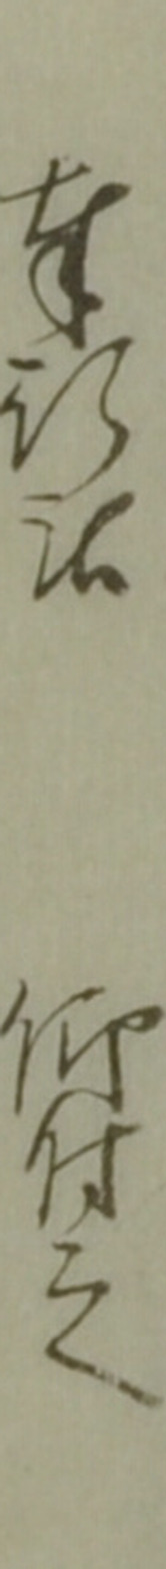奉行被仰付之
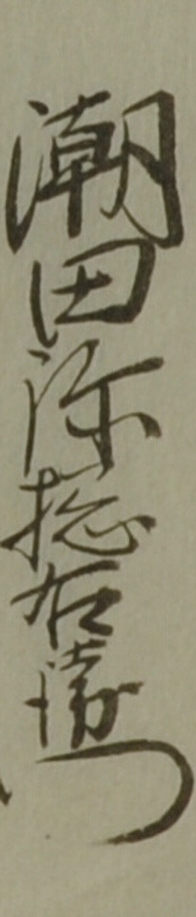潮田弥総右衛門
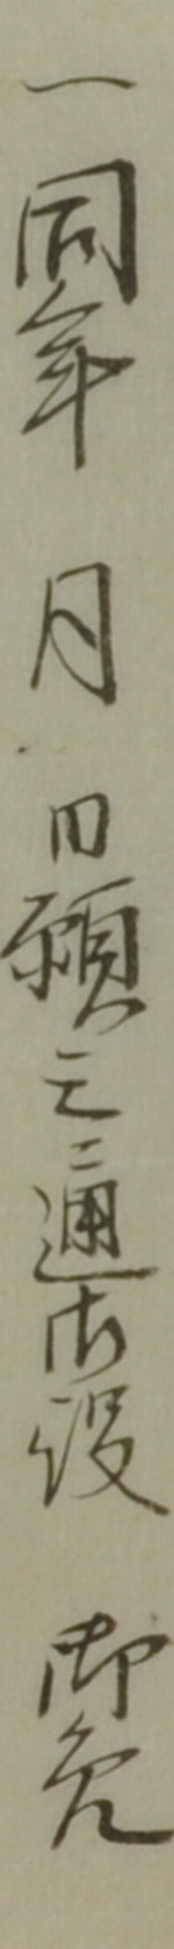一同年月日願之通御役御免
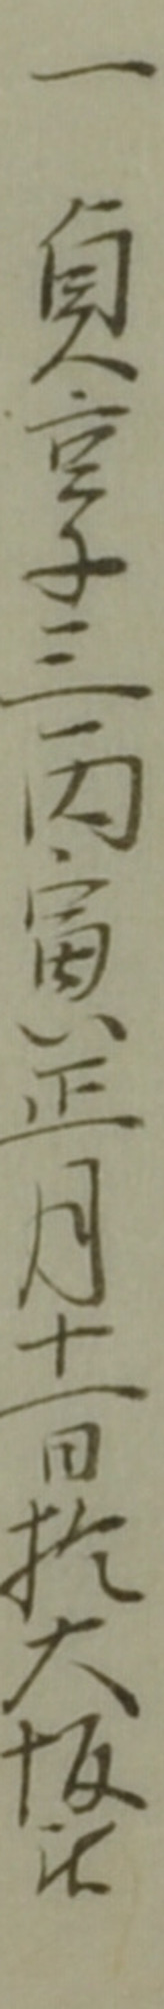一貞享三丙寅正月十一日於大坂被
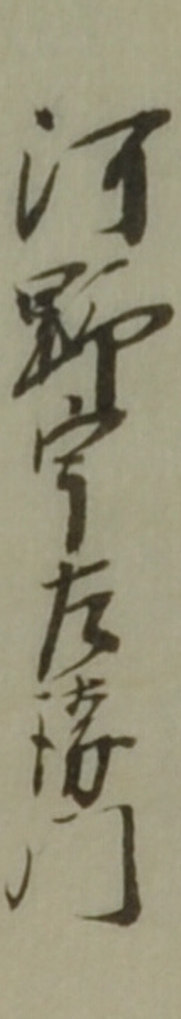河野宇左衛門
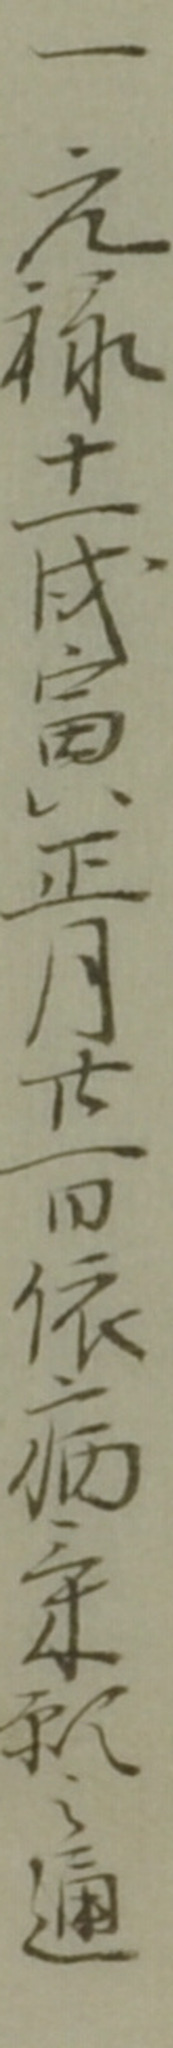一元禄十一戊寅正月廿一日依病気願之通
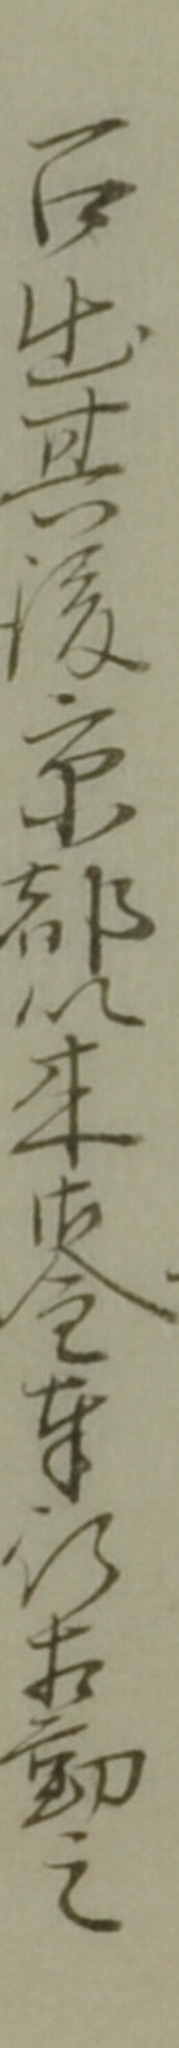召出其後京都以来御金奉行相勤之
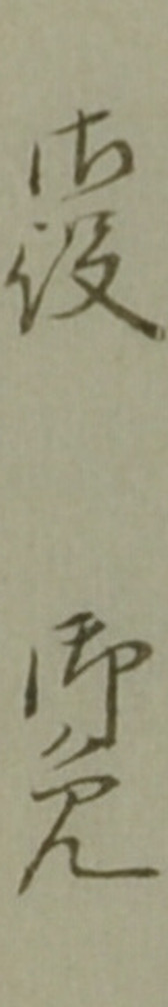御役御免
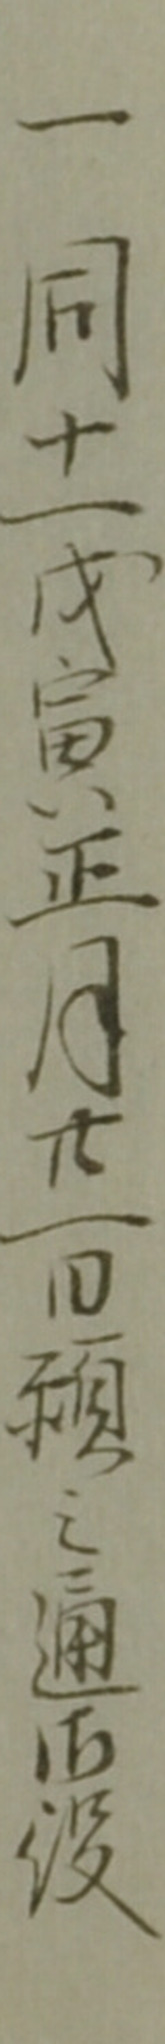一同十一戊寅正月廿一日願之通御役
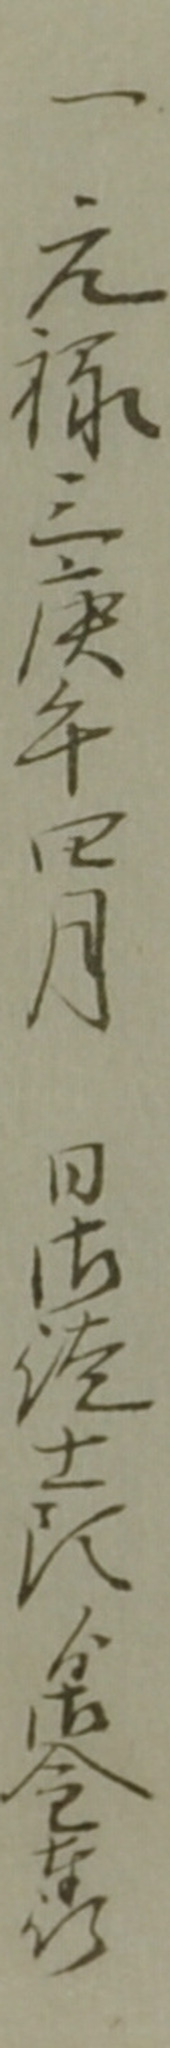一元禄三庚午四月日御徒士頭ゟ御金奉行
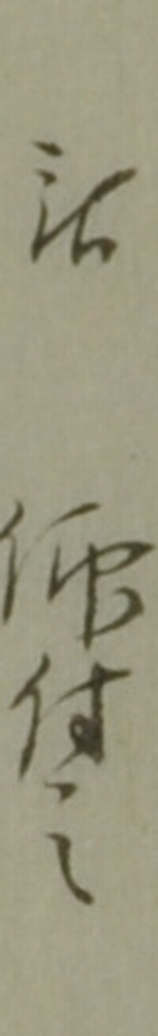被仰付之
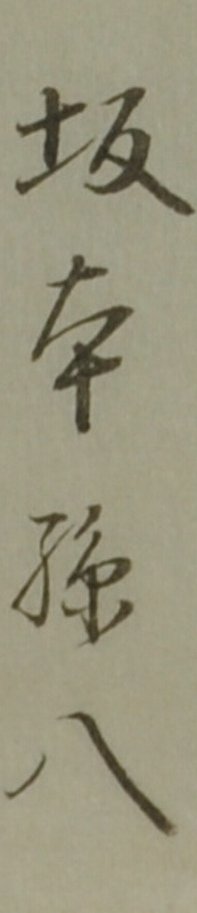坂本孫八
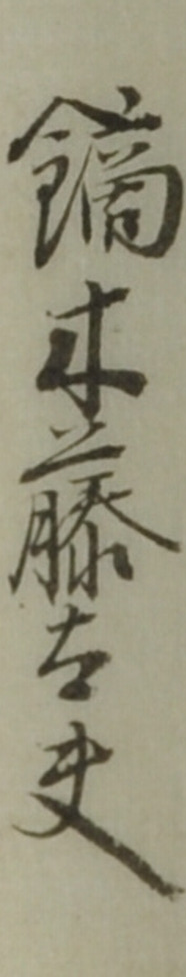鏑木籐太夫

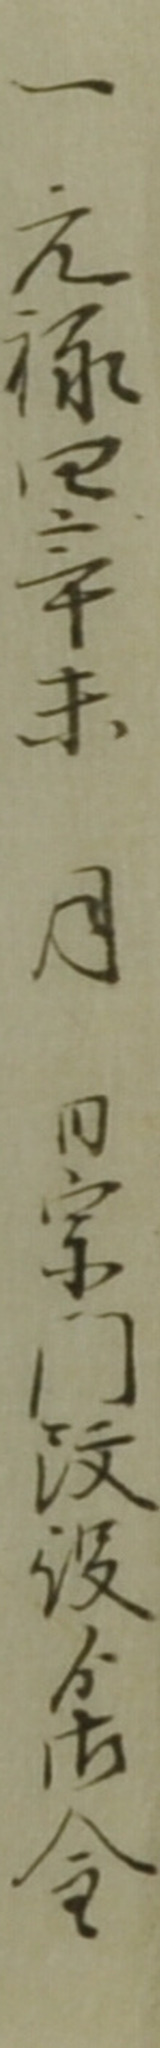一元禄四辛未月日宗門改役ゟ御金
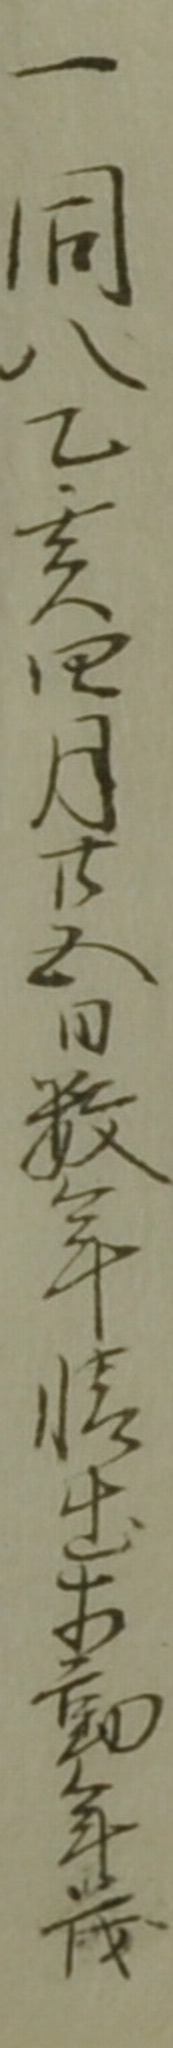一同八乙亥四月廿五日数年情出相勤年幾
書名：諸御役代々録（七）
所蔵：伊那市立高遠町図書館・合同会社AMANE
